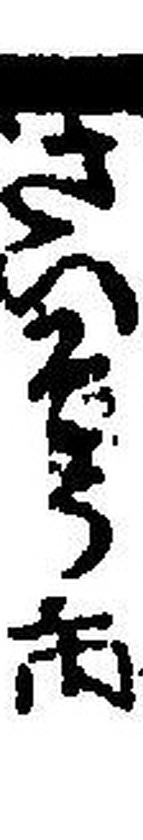さいそう市
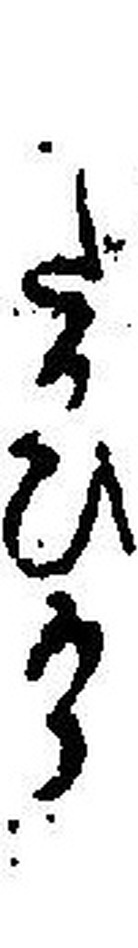たかひから
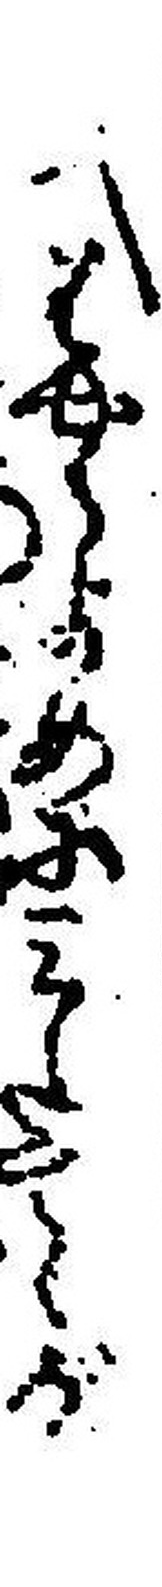〽はやうよめにみたてゝが
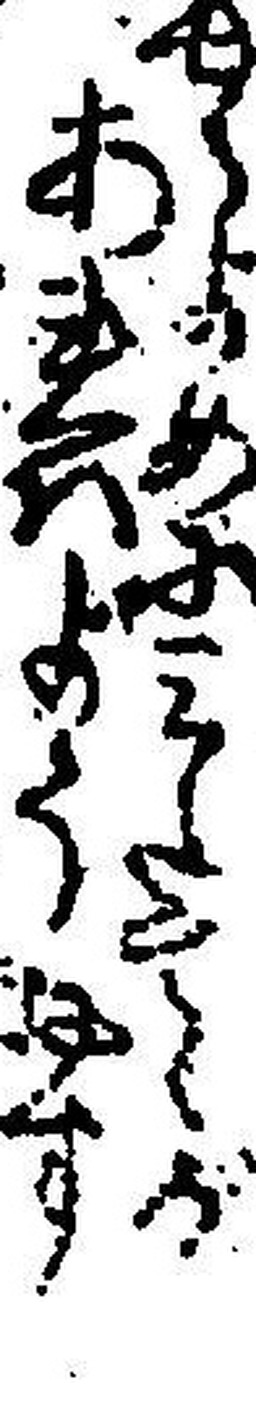あれはようおす
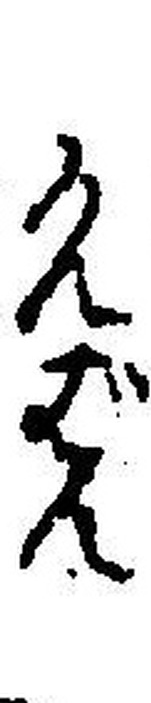かんばん
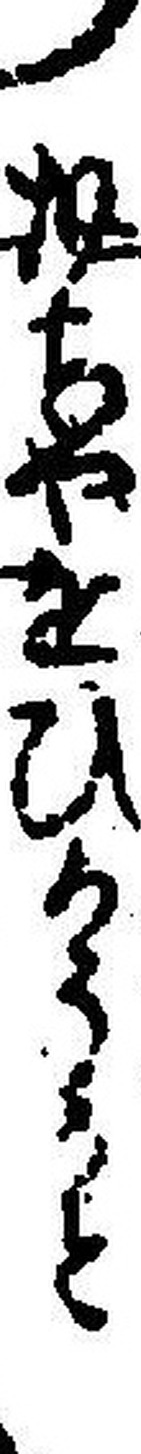おちやをひかうかと
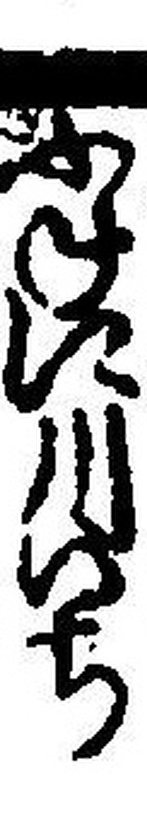ふねに川いち
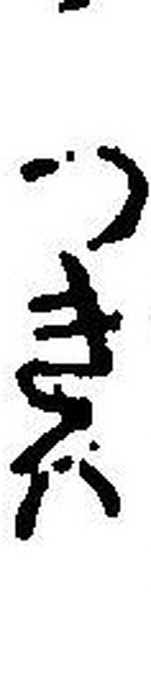つきは
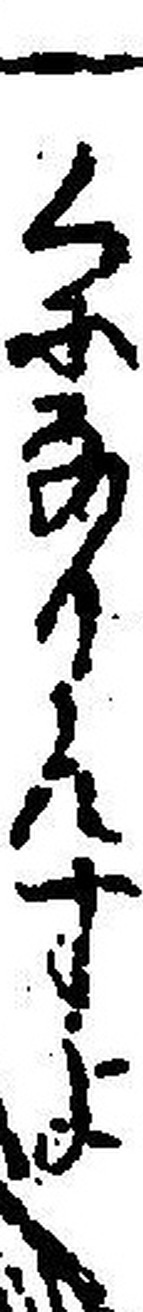くになりんすよ
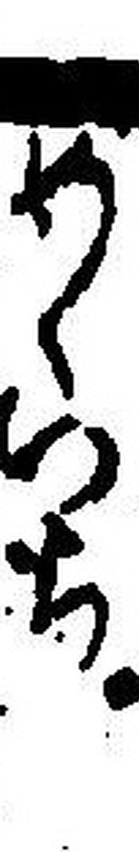めゝいち
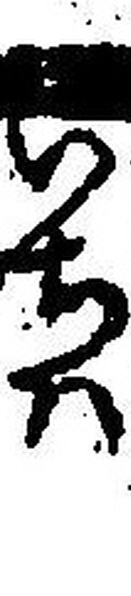いちは
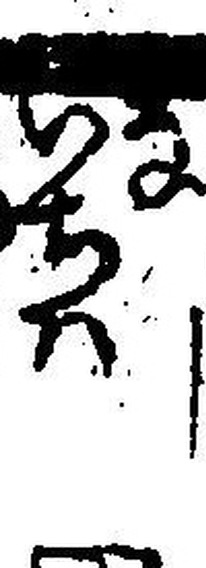いちは
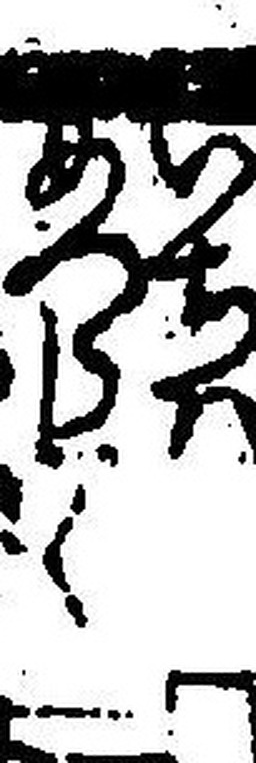めつらしく
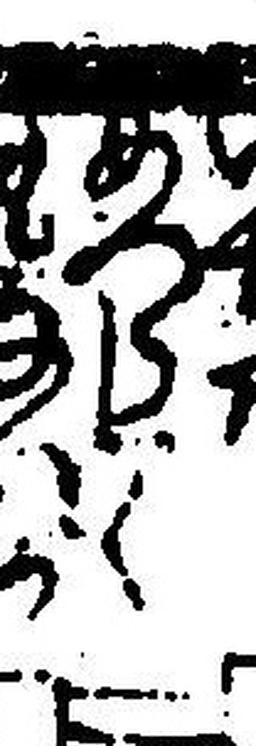もないが
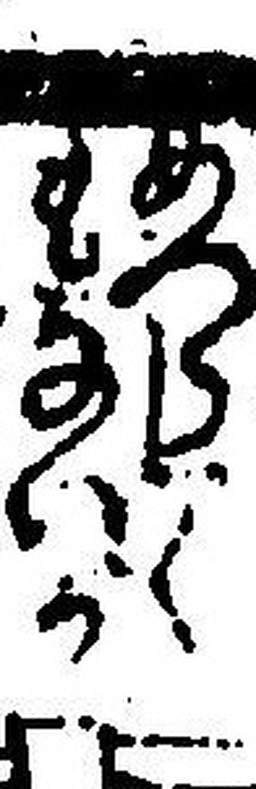もないが
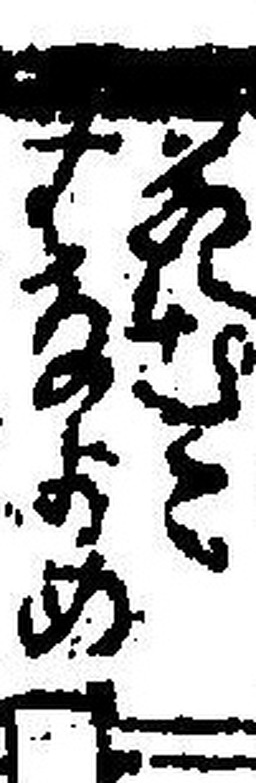はなよめ
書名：徳若水縁起金性 / 樹下石上作
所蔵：東京大学総合図書館 General Library in the University of Tokyo, JAPAN
